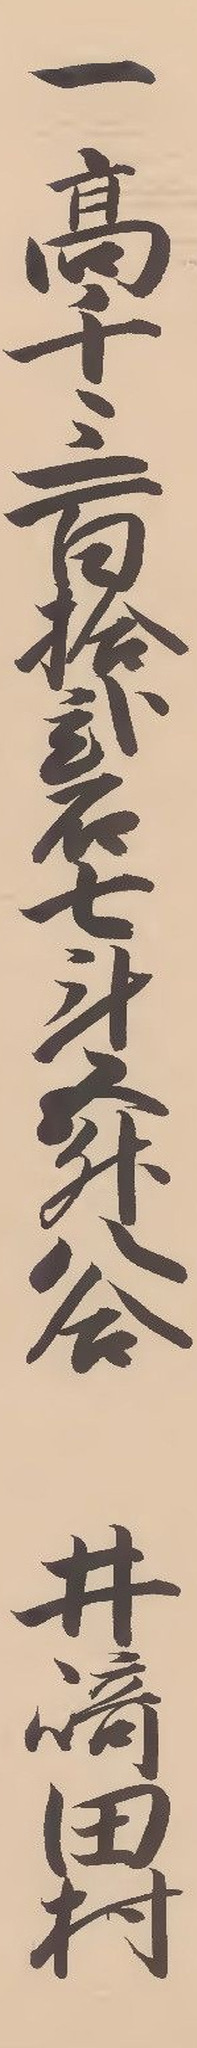一高千三百拾弐石七斗五升八合井崎田村
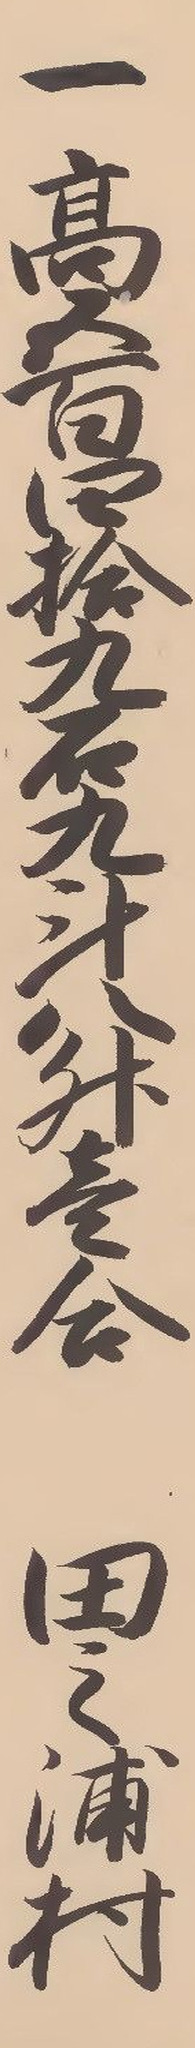一高五百四拾九石九斗八升壱合田之浦村
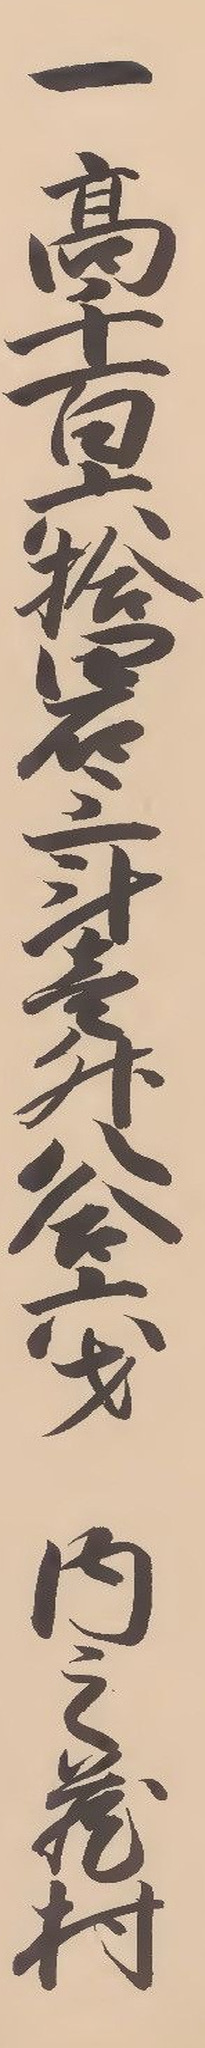一高千百六拾四石三斗壱升八合六才内之蔵村
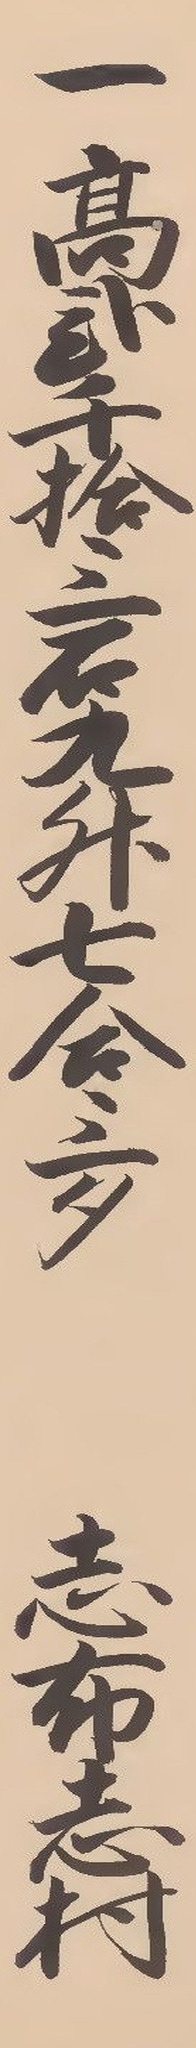一高弐千拾三石九升七合三勺志布志村
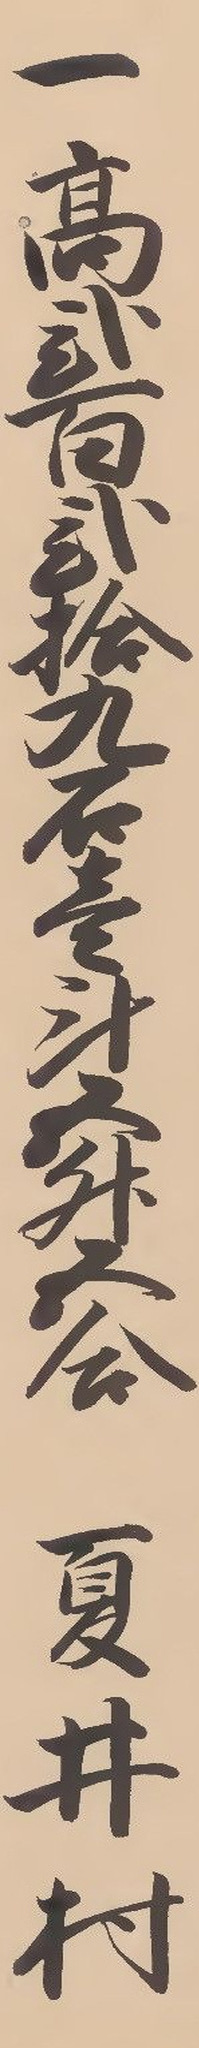一高弐百弐拾九石壱斗五升五合夏井村
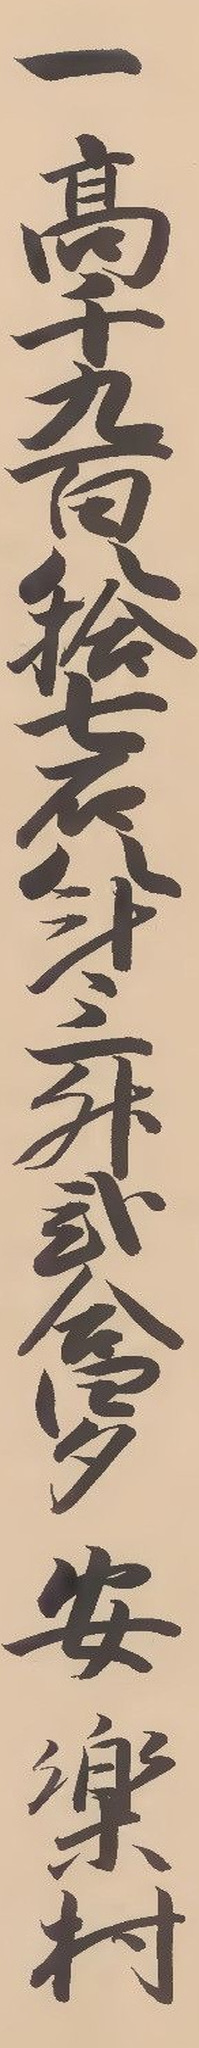一高千九百八拾七石八斗三升弐合四勺安楽村
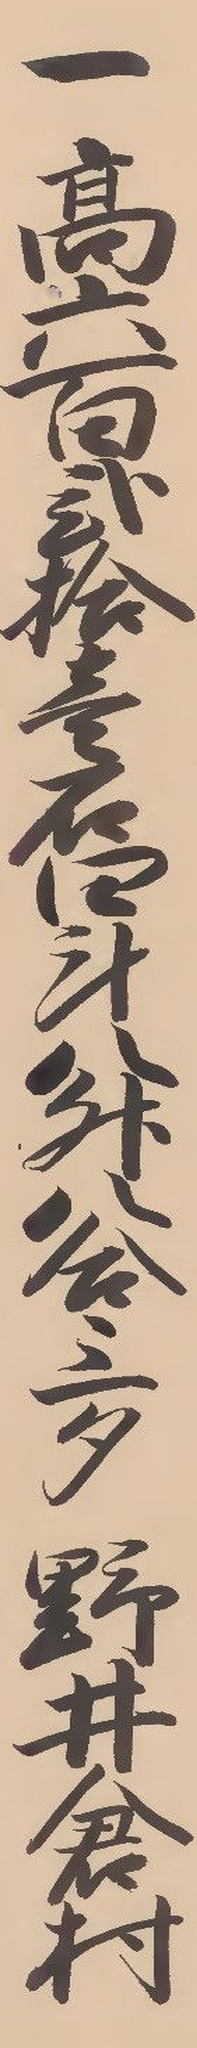一高六百弐拾壱石四斗八升八合三勺野井倉村
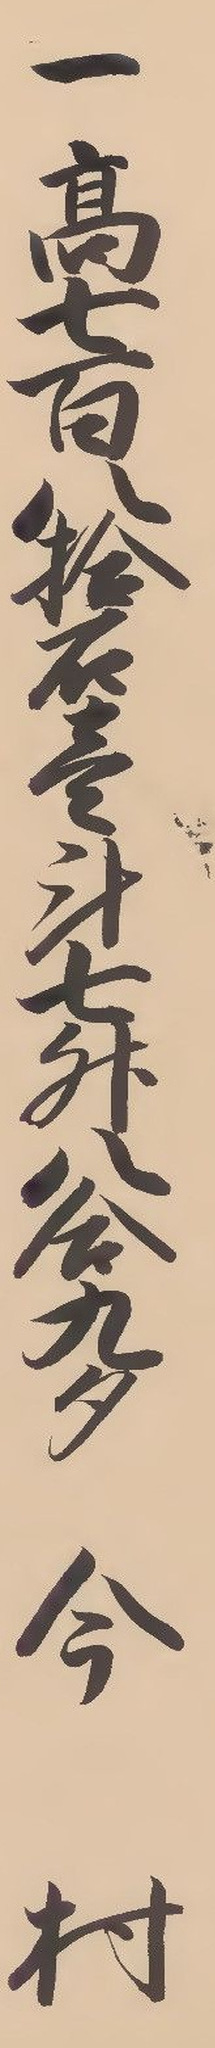一高七百八拾石壱斗七升八合九勺今村

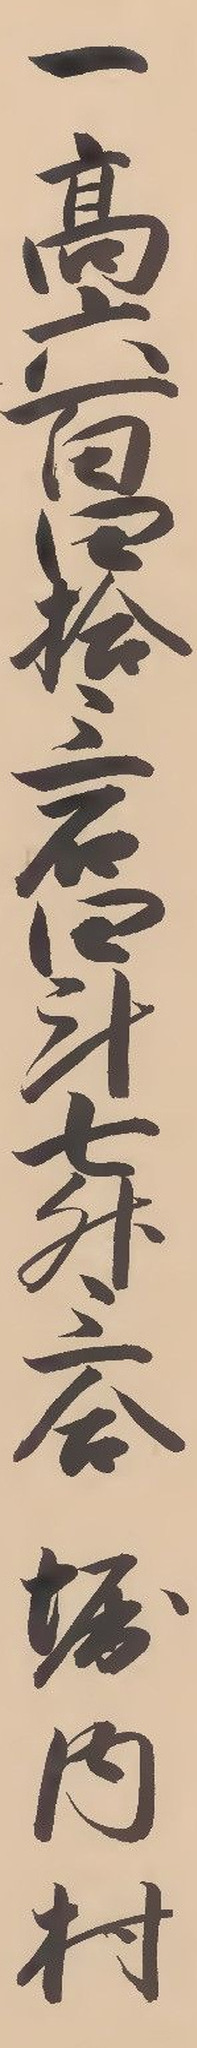一高六百四拾三石四斗七升三合堀内村
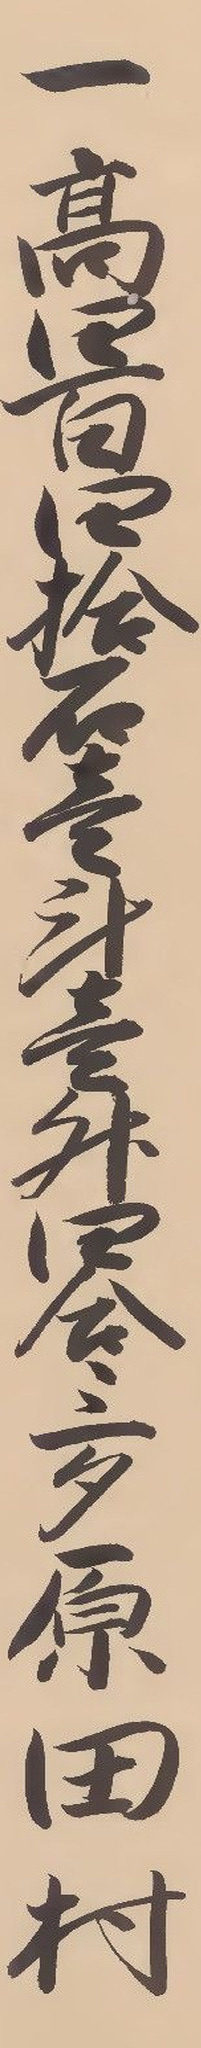一高四百四拾石壱斗壱升四合三勺原田村
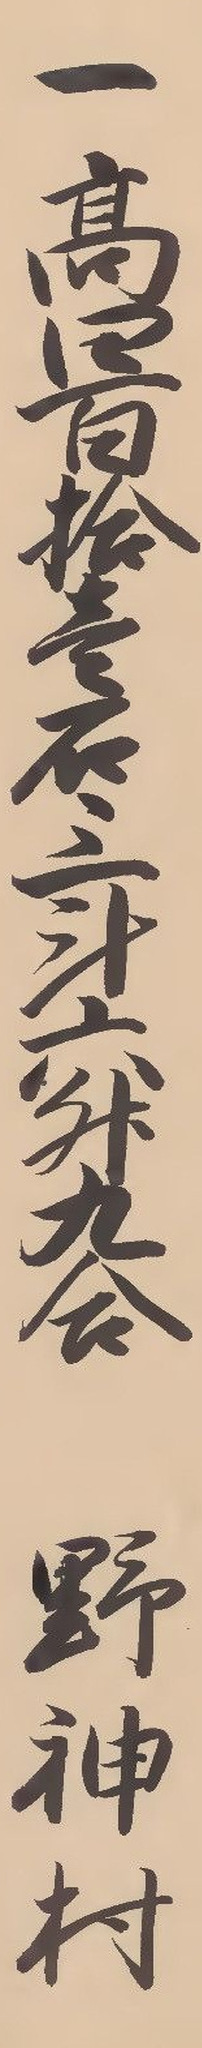一高四百拾壱石三斗六升九合野神村
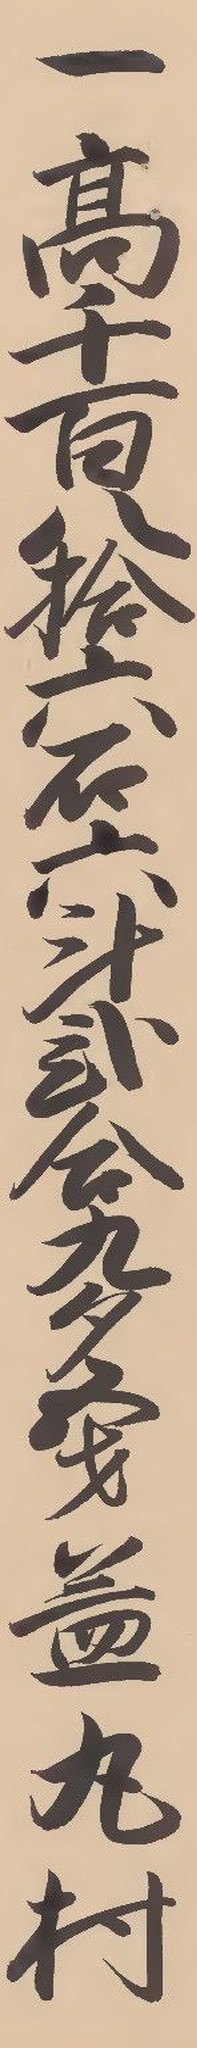一高千百八拾六石六斗弐合九勺五才益丸村
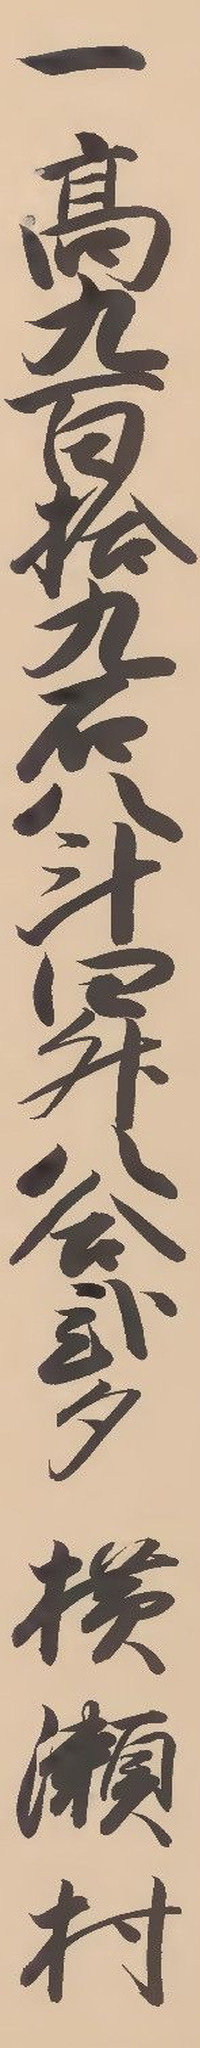一高九百拾九石八斗四升八合弐勺横瀬村
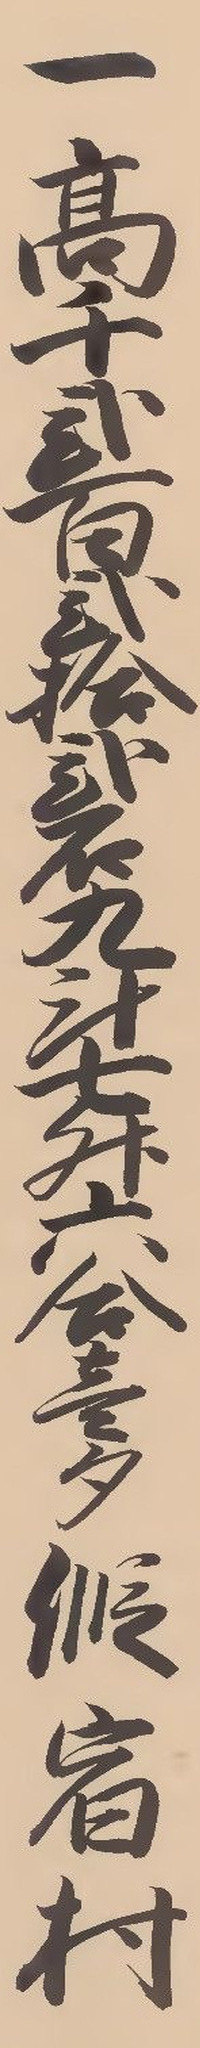一高千弐百弐拾弐石九斗七升六合壱勺仮宿村
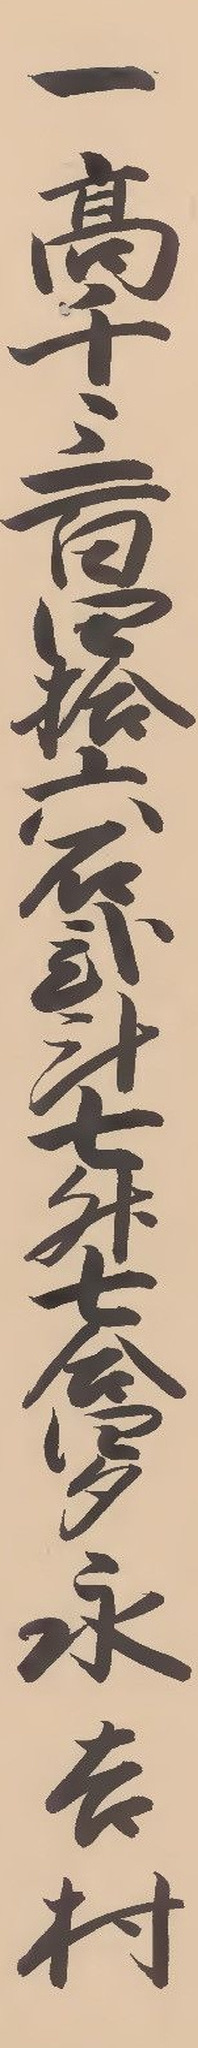一高千三百四拾六石弐斗七升七合四勺永吉村
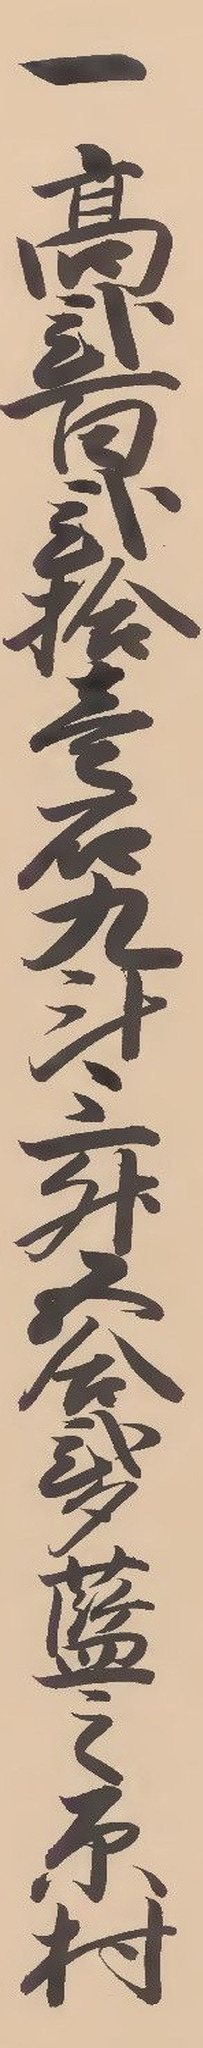一高弐百弐拾壱石九斗三升五合弐勺藍之原村
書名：日向国郷帳
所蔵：国立公文書館 National Archives of Japan
